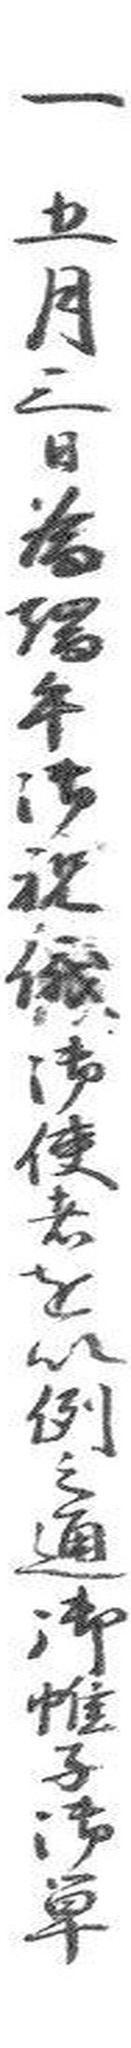一五月三日為端午御祝儀御使者を以例之通御帷子御単
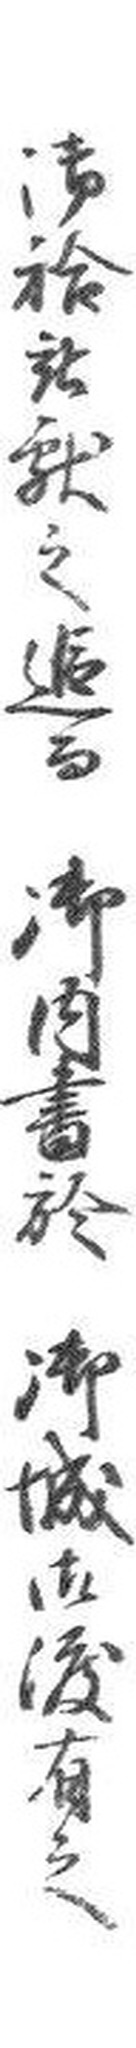御袷被献之追而御内書於御城御渡有之
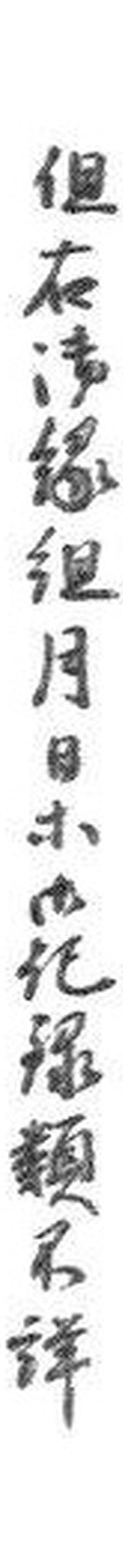但右御縁組月日等御記録類不詳
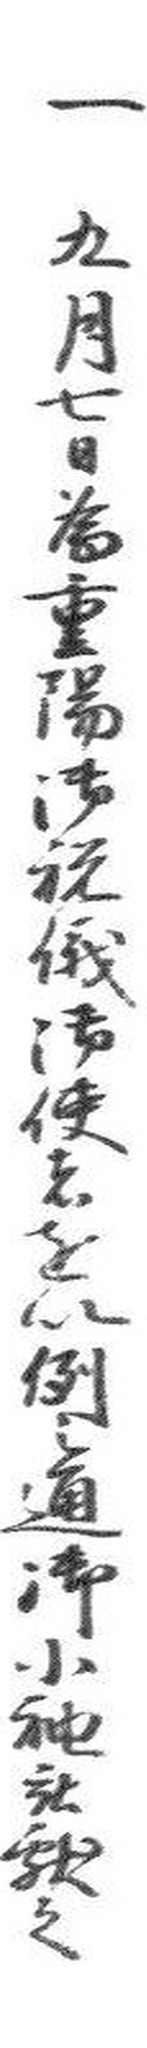一九月七日為重陽御祝儀御使者を以例之通御小袖被献之
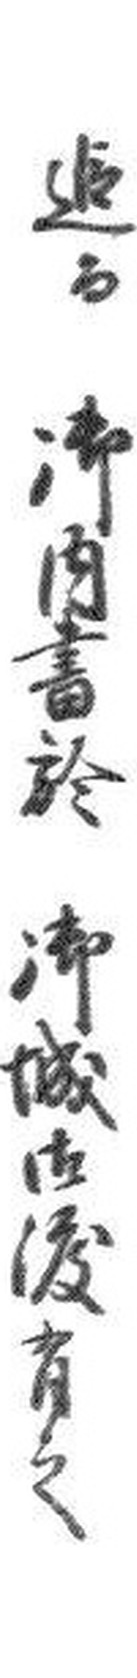追而御内書於御城御渡有之
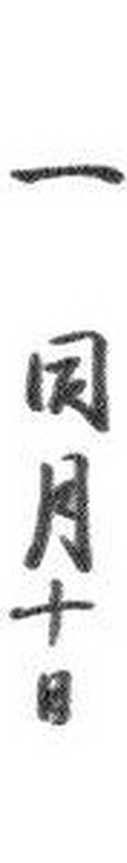一同月十日
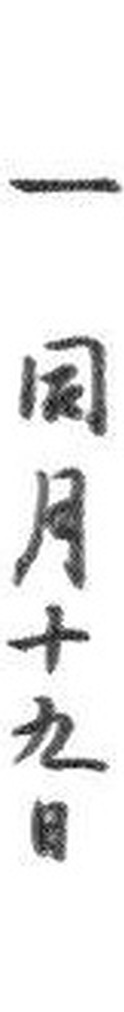一同月十日
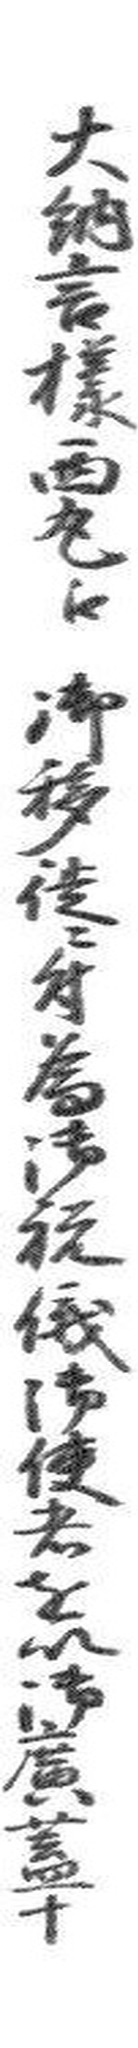大納言様西丸江御移徙ニ付為御祝儀御使者を以御広蓋十
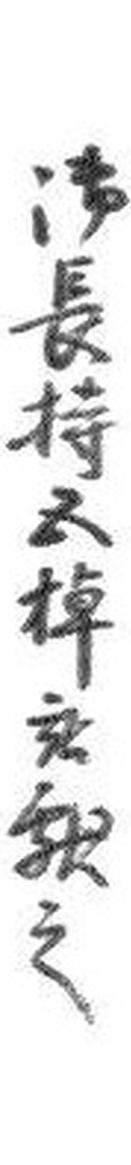御長持五棹被献之

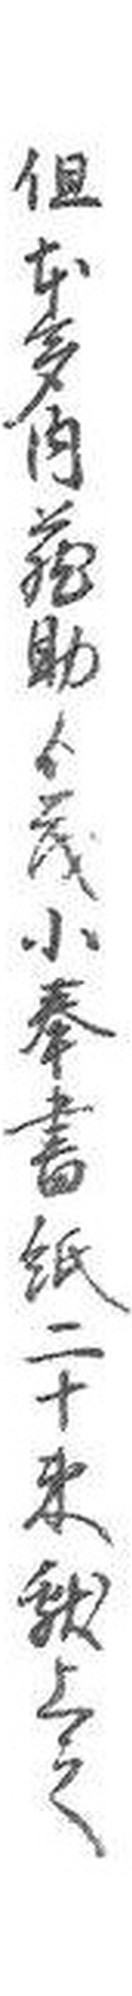但本多内蔵助ゟ茂小奉書紙二十束献上之
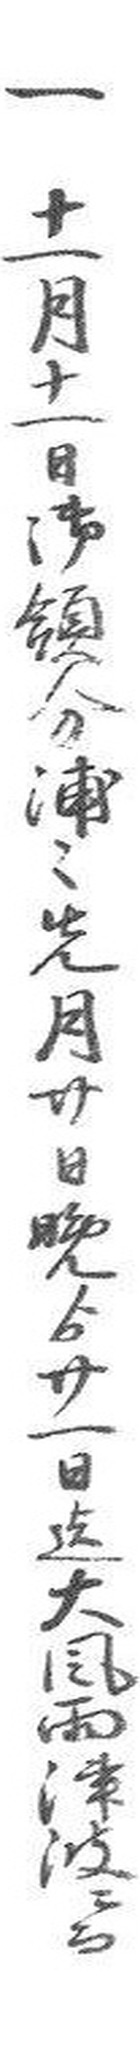一十一月十一日御領分浦々先月廿日晩ゟ廿一日迄大風雨津波
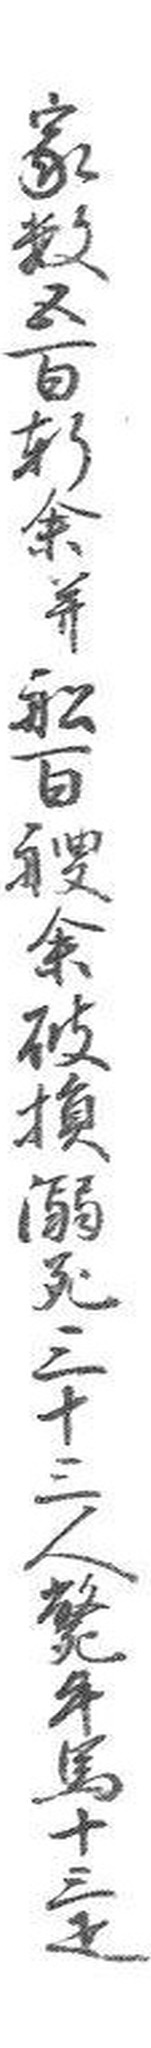家数五百軒余并船百艘余破損溺死三十三人斃牛馬十三疋
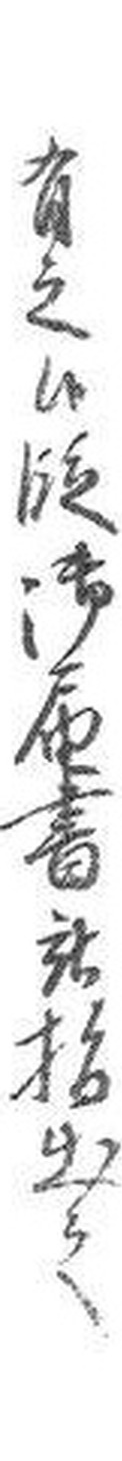有之候段御届書被指出之
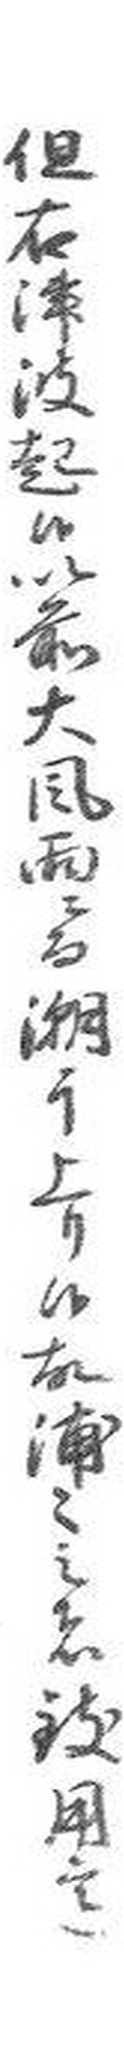但右津波起候以前大風雨ニ而潮干上り候故浦々之者致
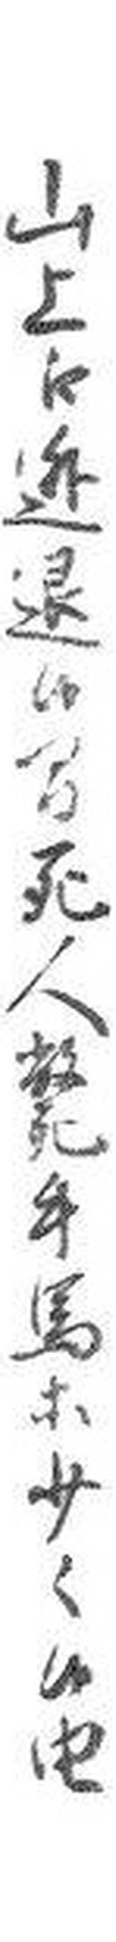山上江逃退候間死人斃牛馬等少く候由
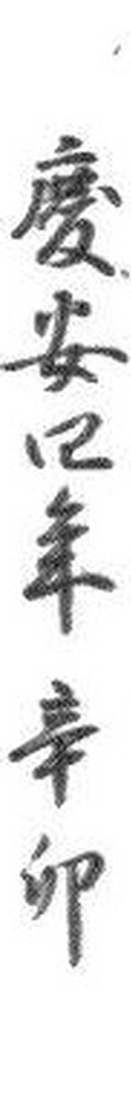慶安四年辛卯
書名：家譜 五 光通公 従寛永十三年到万治二年
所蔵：福井県文書館 Fukui Prefectural Archives
